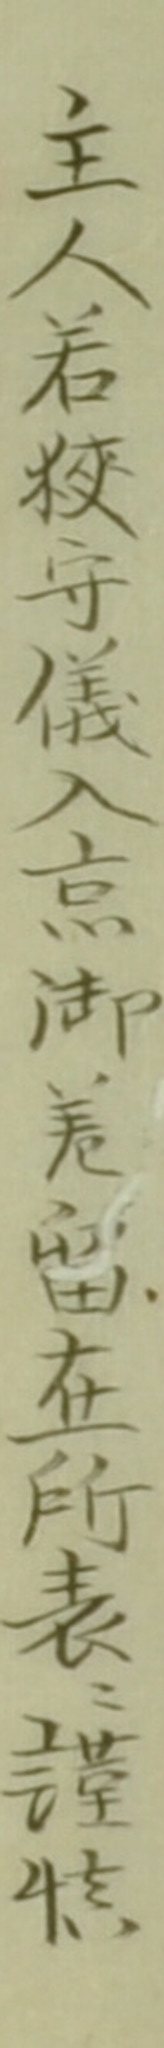主人若狭守儀入京差留在所表ニ謹慎
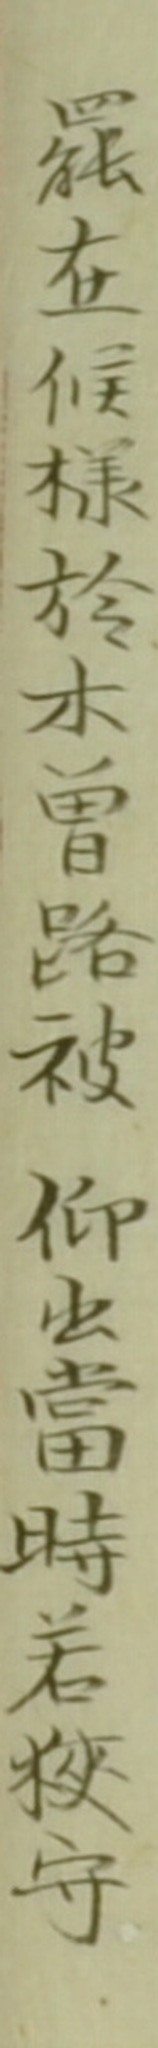罷在候様於木曽路被仰出當時若狭守
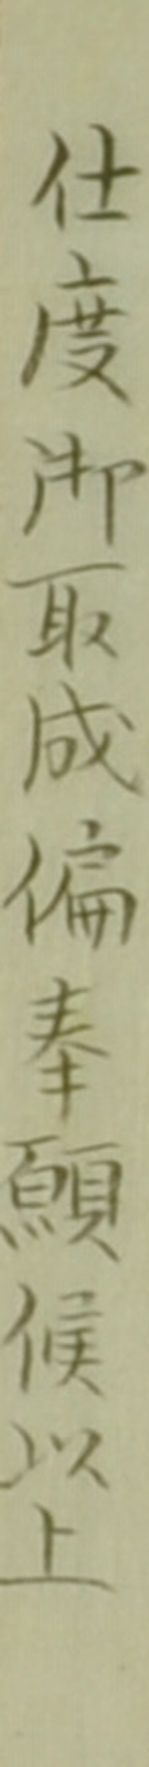仕度御取成偏奉願候以上
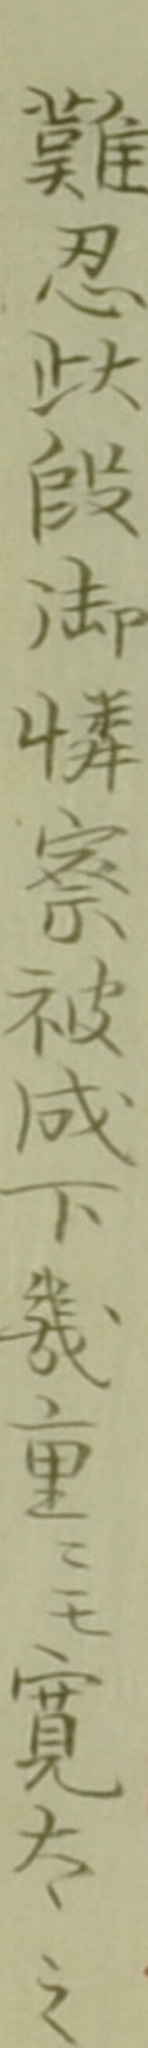難忍此段御憐察被成下幾重ニモ寛太之
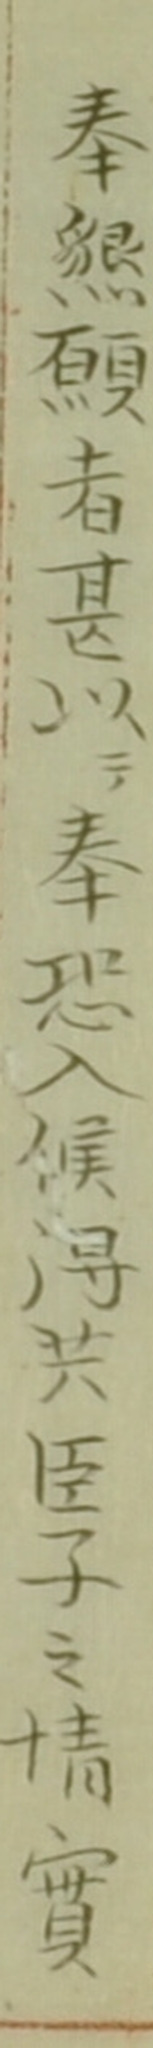奉懇願者甚以テ奉恐入候得共臣子之情實
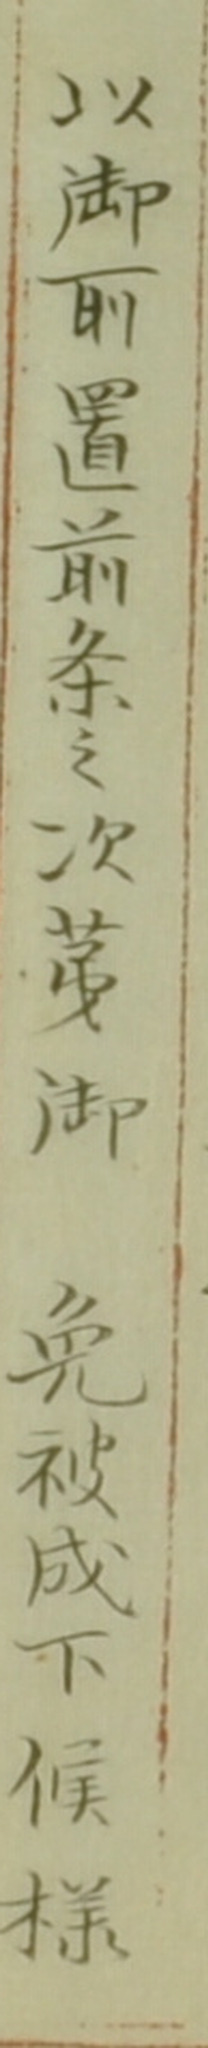以御取置前条之次第御免被成下候様
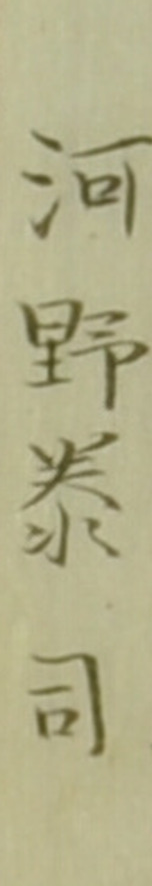河野泰司

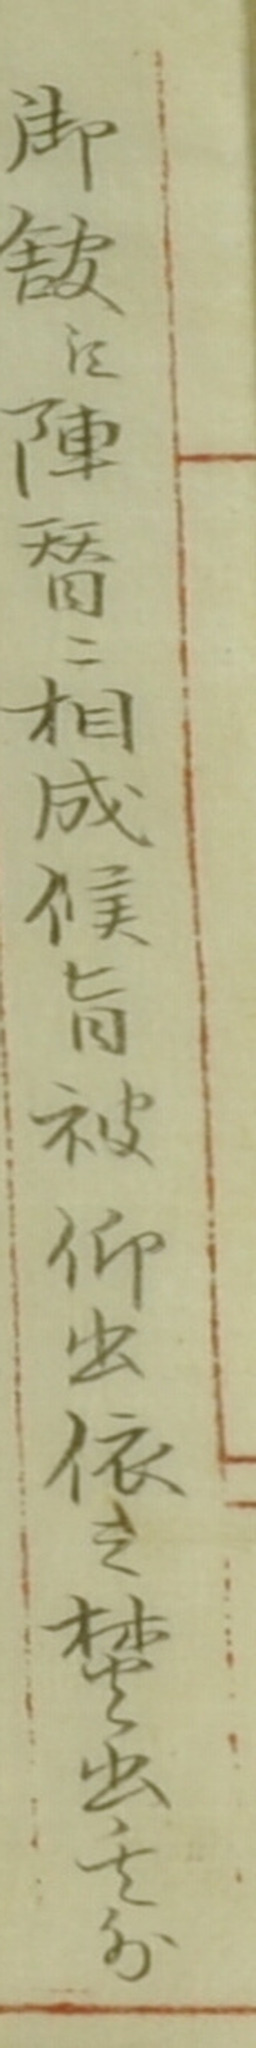御舘江陣替ニ相成候旨被仰出依之焚出其外
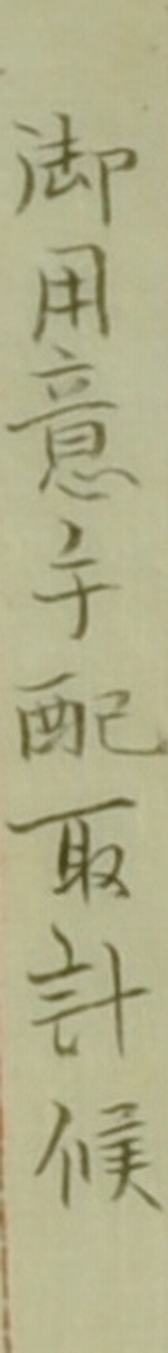御用意手配取計候
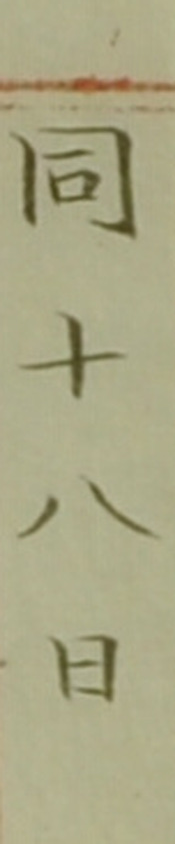同十八日
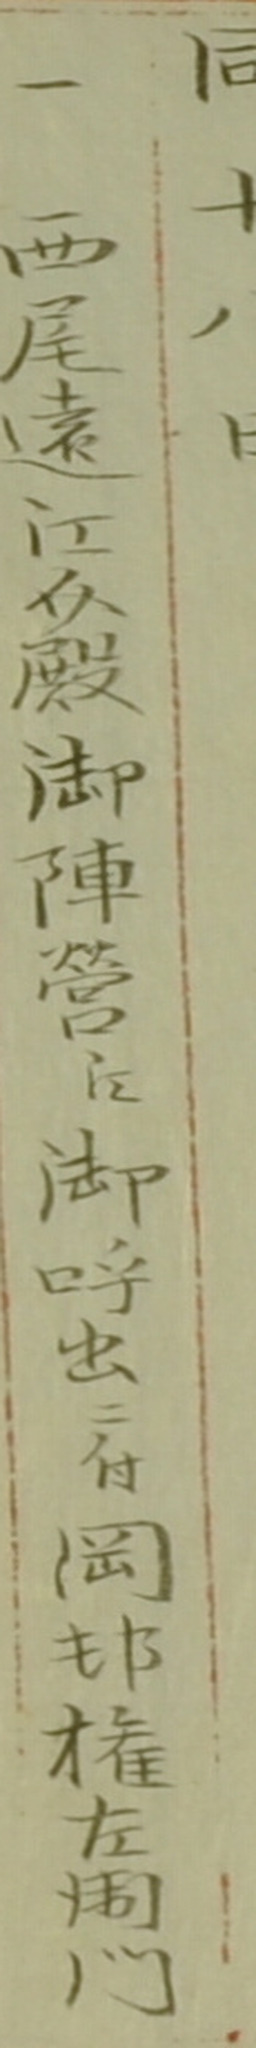一西尾遠江介殿御陣営江御呼出ニ付岡邨権左衛門
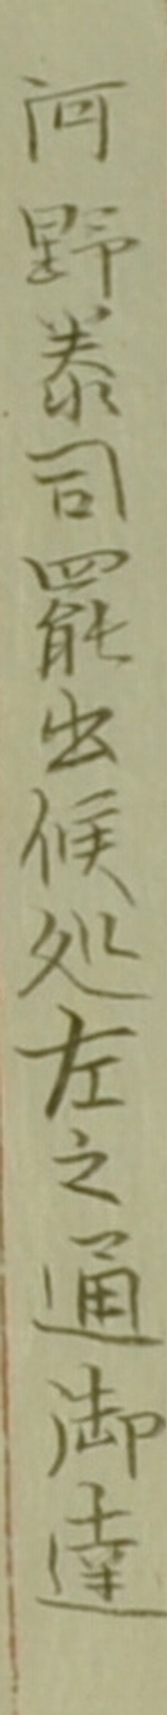河野泰司罷出候処左之通御達
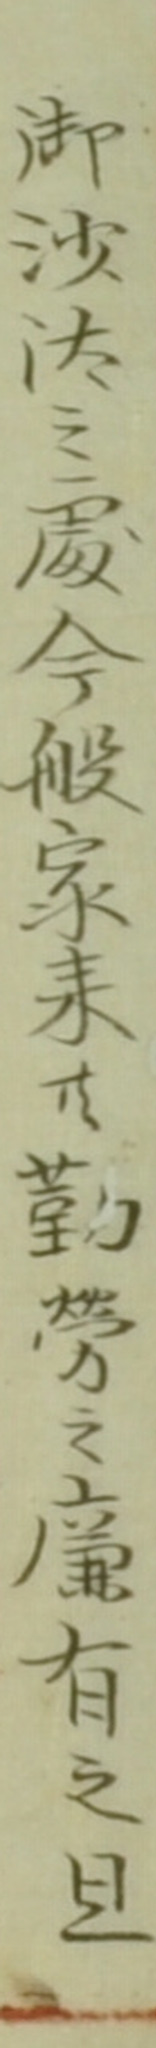御沙汰之處今般家来共勤労之廉有之且
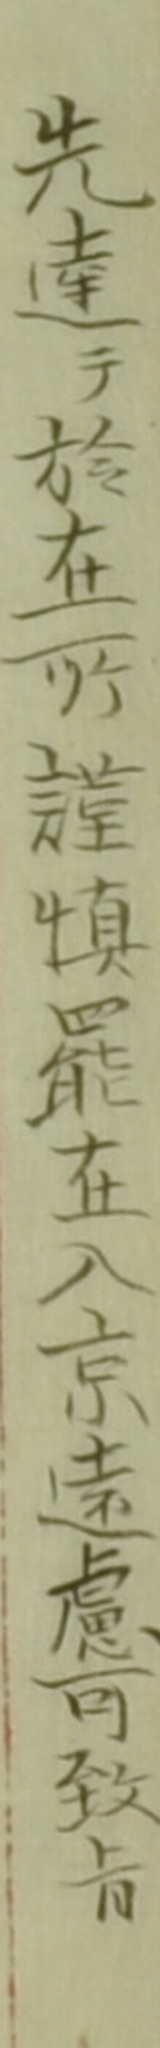先達テ於在所謹慎罷在入京遠慮可致旨
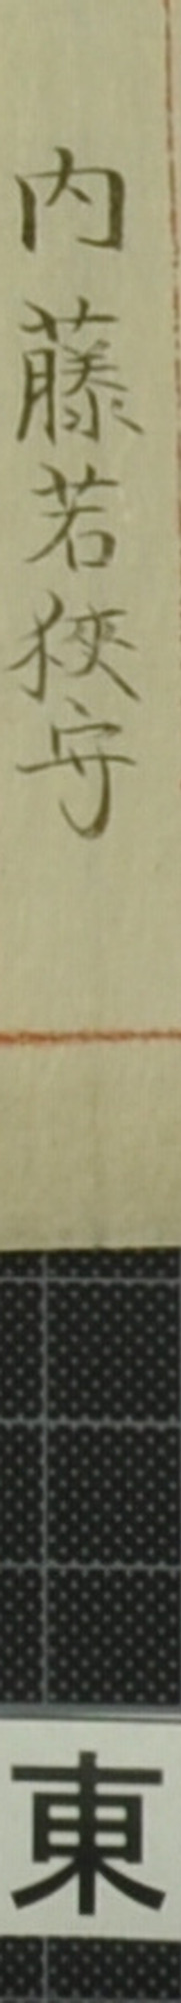内藤若狭守
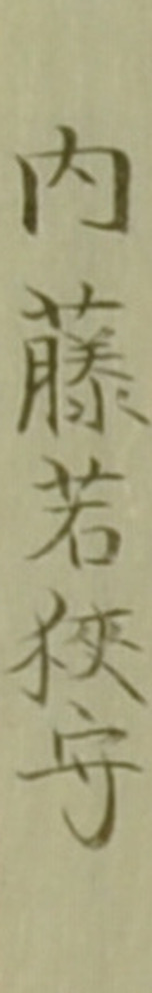内藤若狭守
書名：御東征ニ付甲州口兵食人馬御賄之事件（控）
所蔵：伊那市立高遠町図書館・合同会社AMANE
